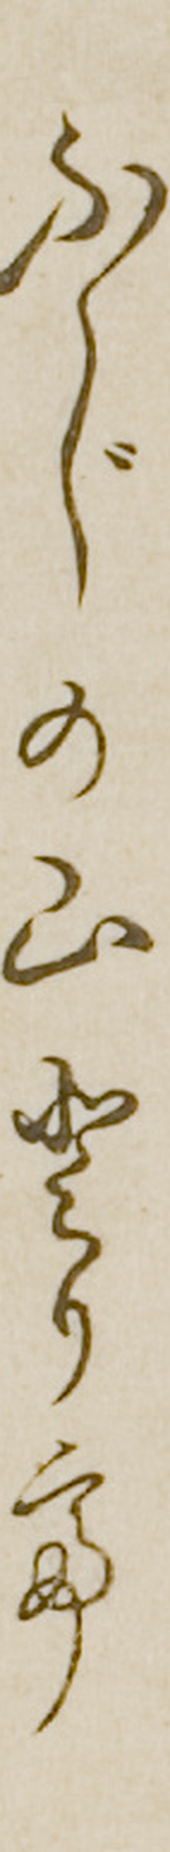ふじの山登りて
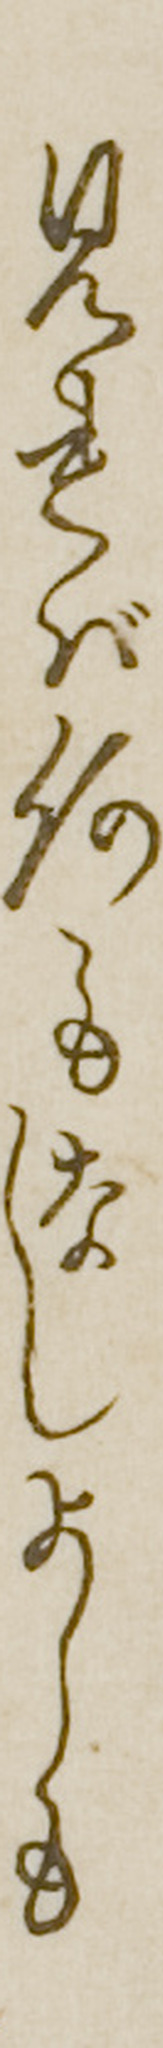見れば何もなしよしも
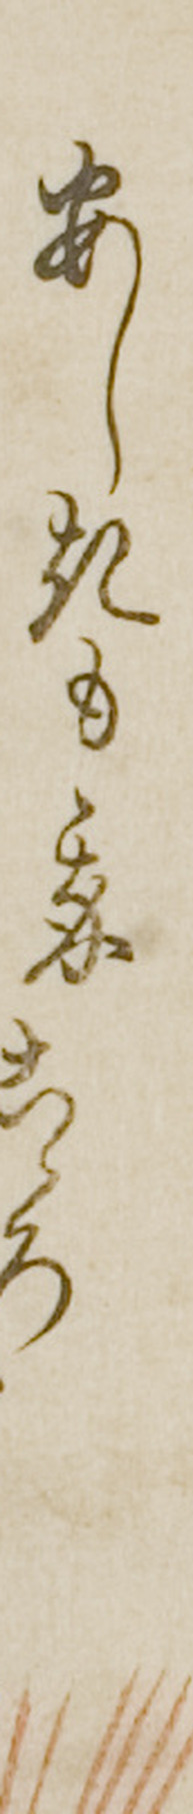あしきも我こゝろなり
